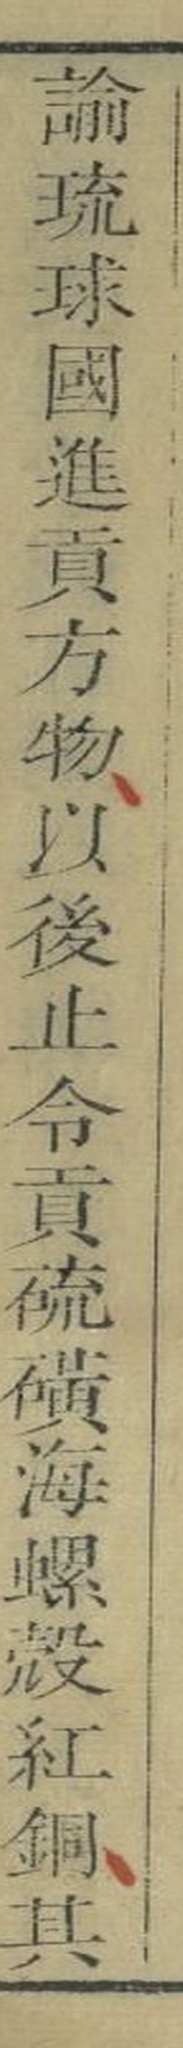諭琉球国進貢方物以後止令貢硫磺海螺殻紅銅其
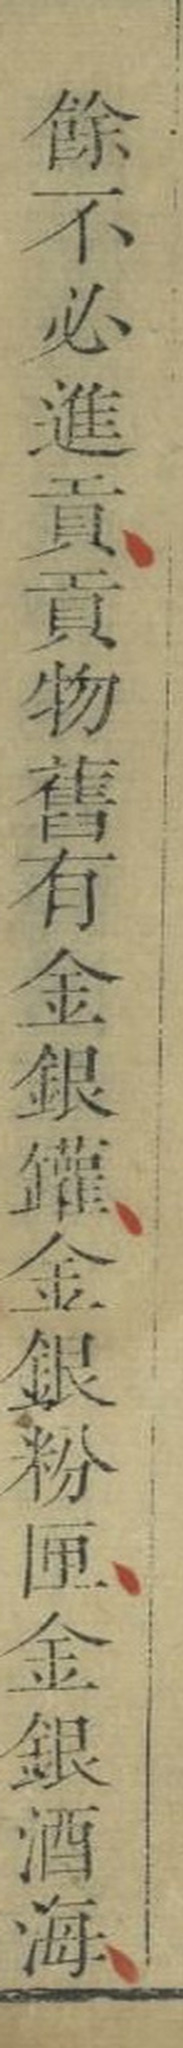余不必進貢貢物旧有金銀缶金銀粉匣金銀酒海
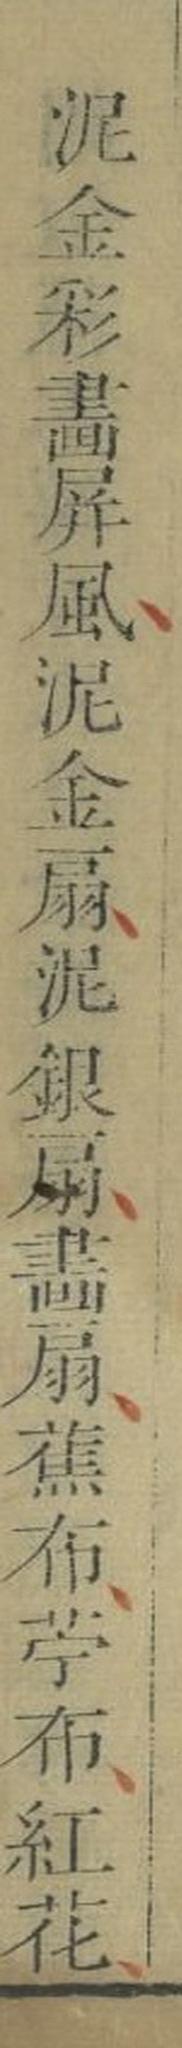泥金彩画屏風泥金扇泥銀扇画扇蕉布苧布紅花

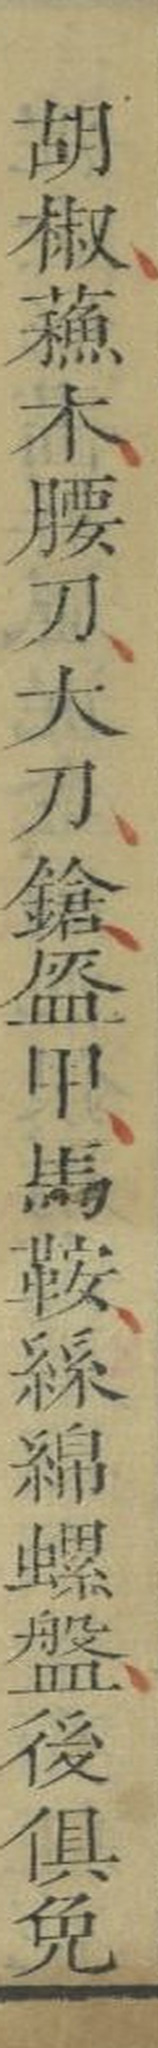胡椒蘇木腰刀大刀鎗盔甲馬鞍糸綿螺盤後俱免
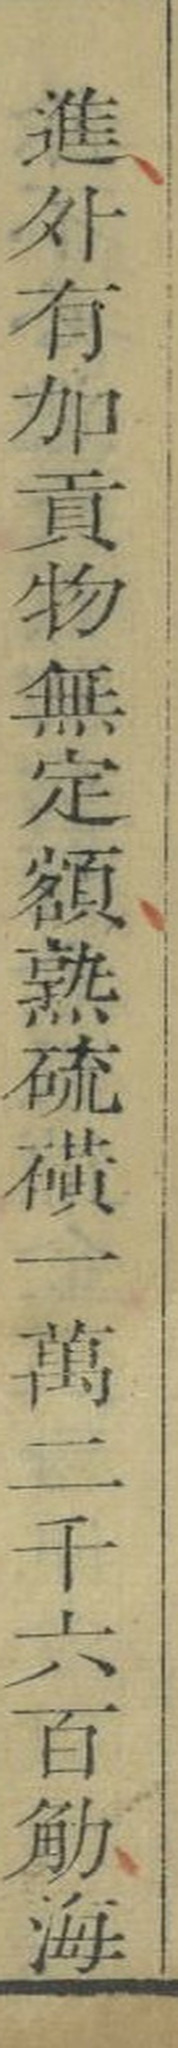進外有加貢物無定額熟硫磺一万二千六百觔海
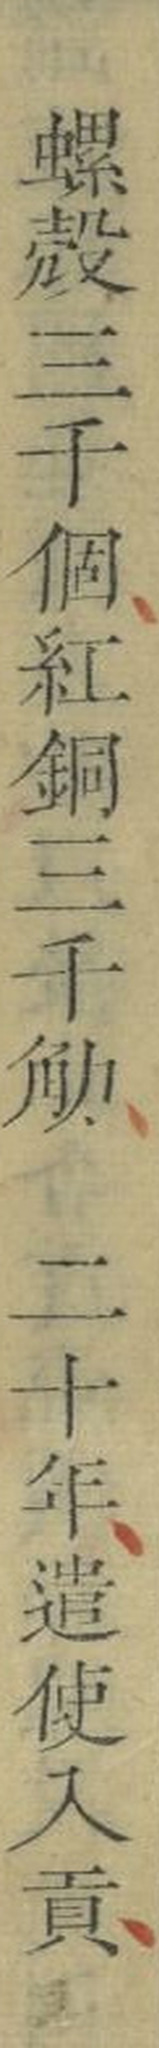螺殻三千個紅銅三千觔二十年遣使入貢
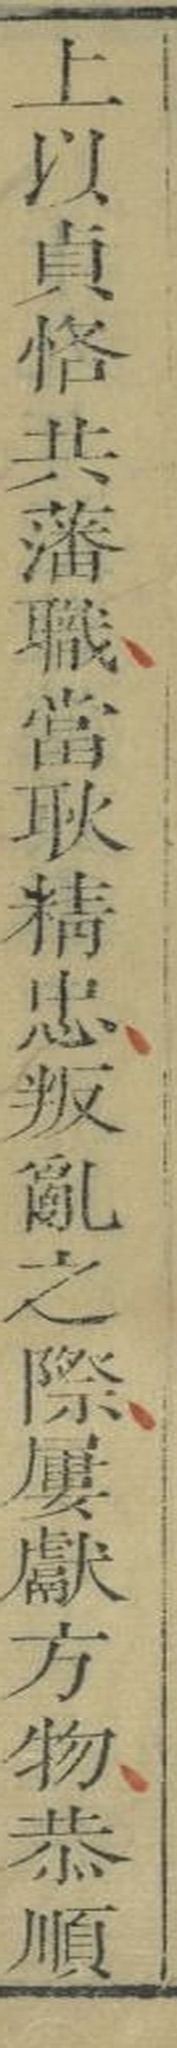上以貞恪共藩職当耿精忠叛乱之際屢献方物恭順
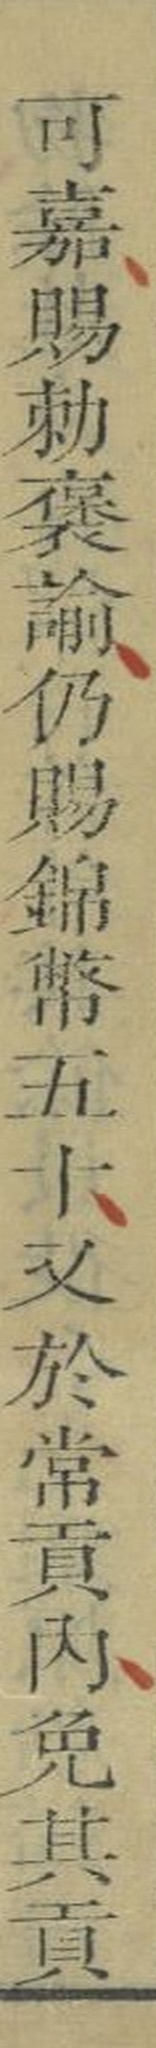可嘉賜勅褒諭仍賜錦幣五十又於常貢内免其貢
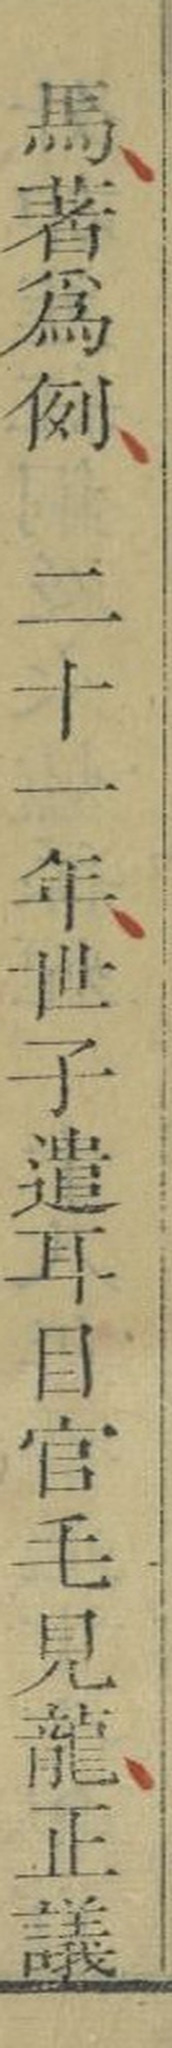馬著為例二十一年世子遣耳目官毛見竜正議
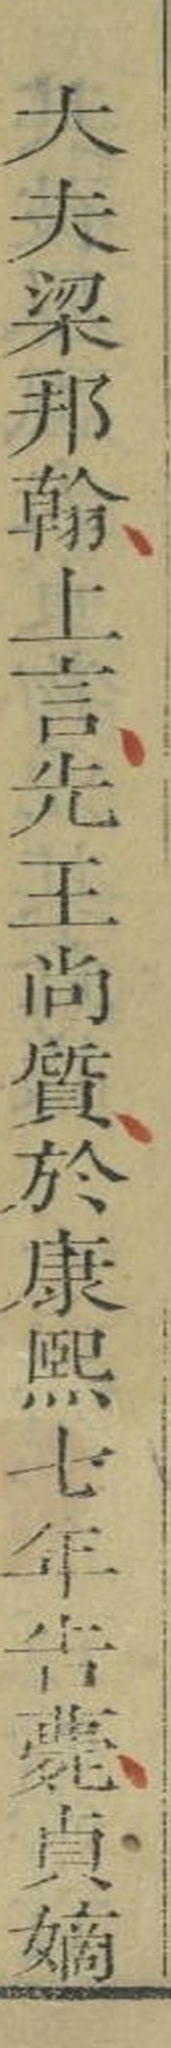大夫梁邦翰上言先王尚質於康煕七年告薨貞嫡
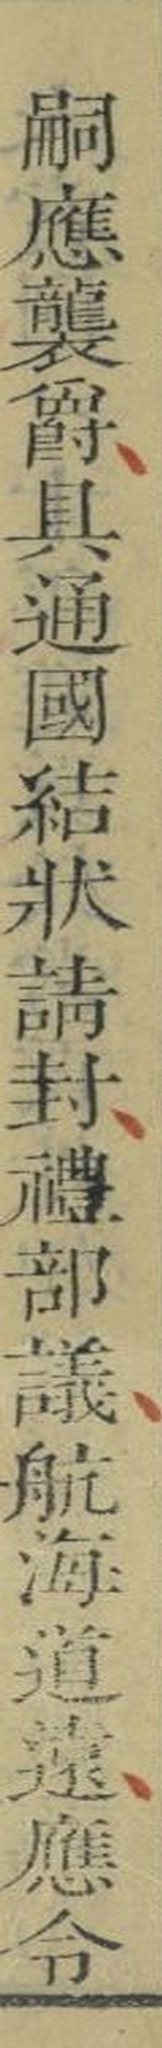嗣応襲爵具通国結状請封礼部議航海道遠応令
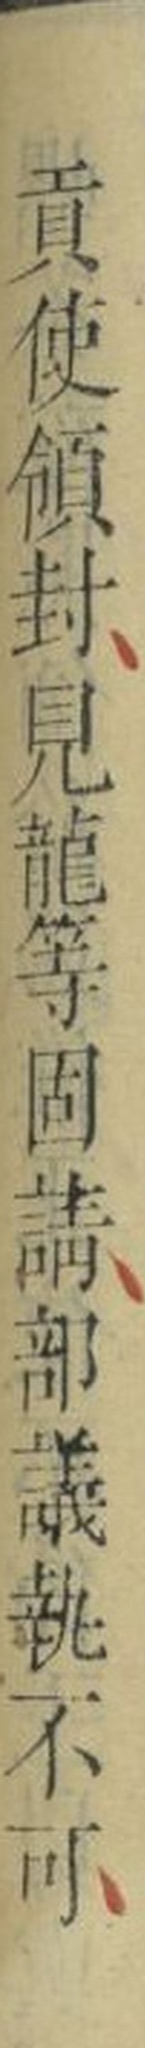貢使領封見竜等固請部議執不可
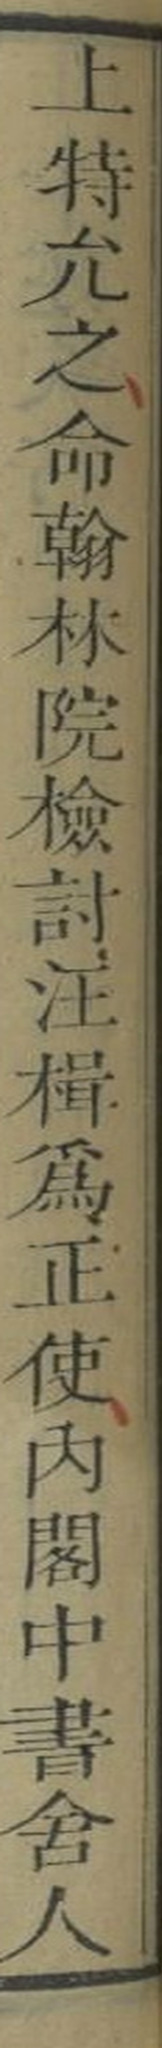上特允之命翰林院検討汪楫為正使内閣中書舎人
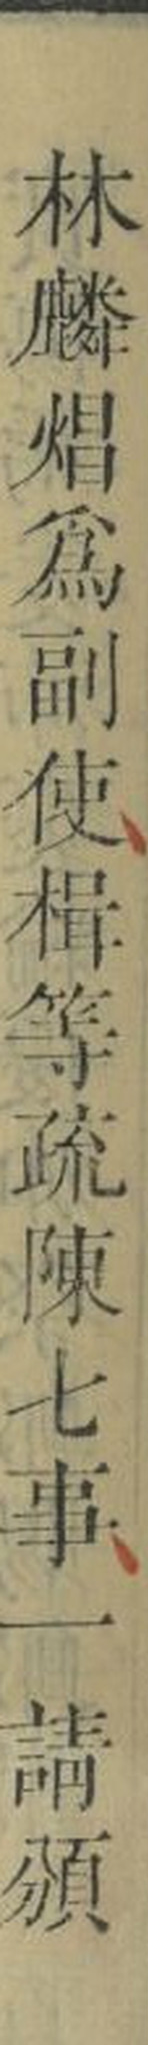林麟焻為副使楫等疏陳七事一請頒
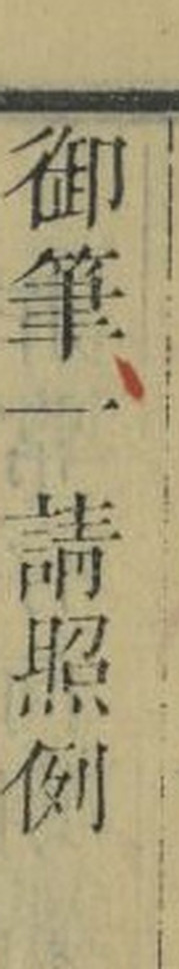御筆一請照例
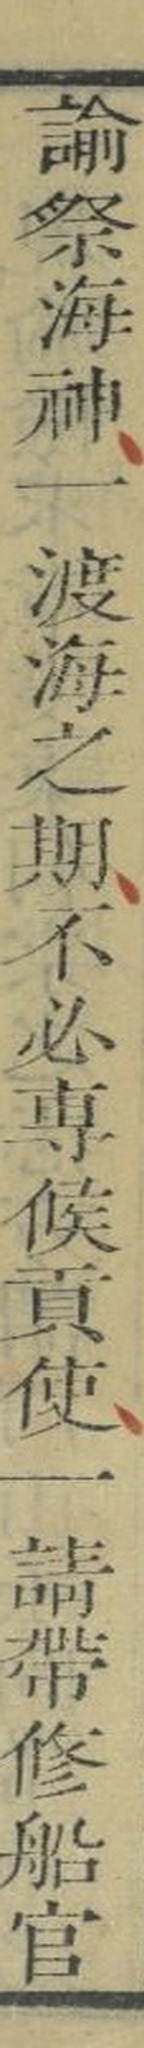諭祭海神一渡海之期不必専候貢使一請帯修船官
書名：中山伝信録 巻三
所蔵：University of the Ryukyus Library
